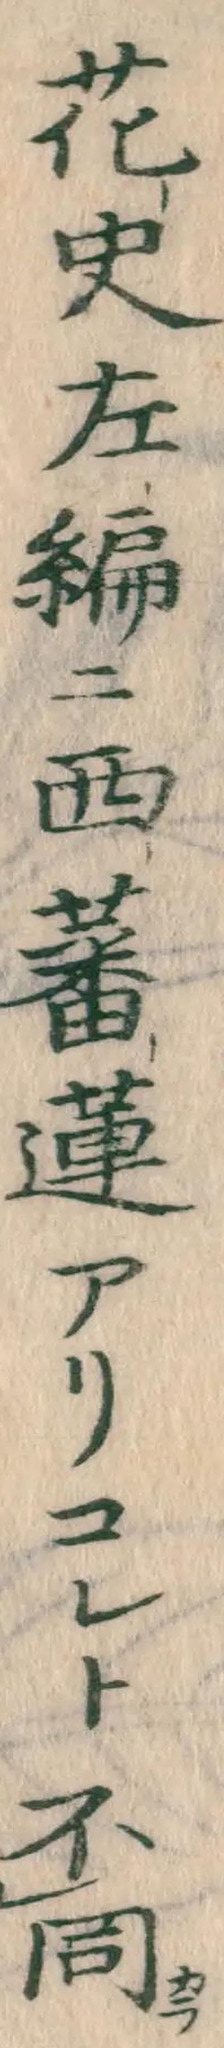花-史左-編ニ西-蕃-蓮アリコレト不同
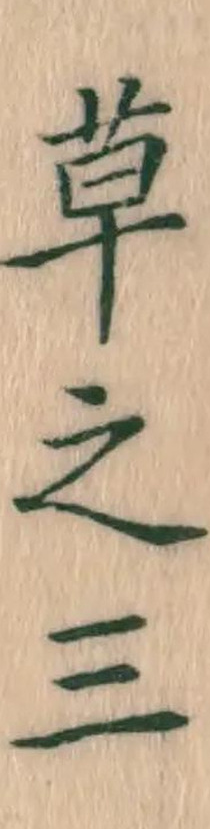草之三
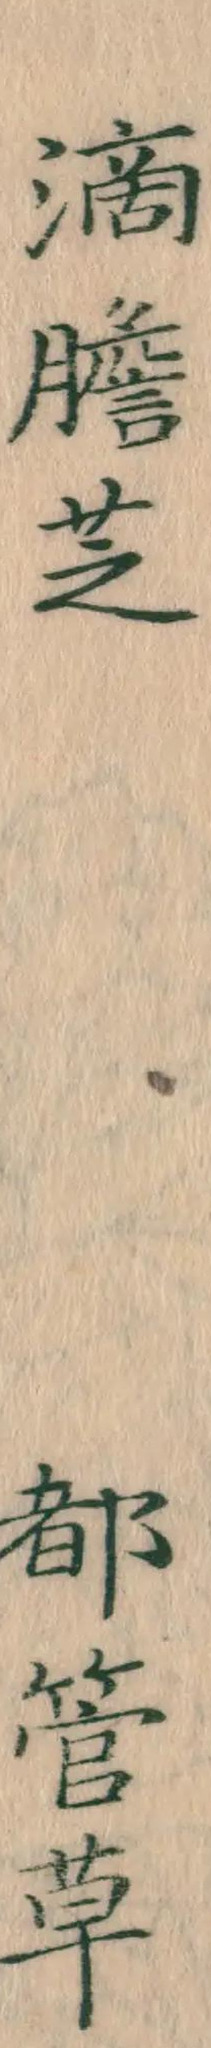滴膽芝都管草

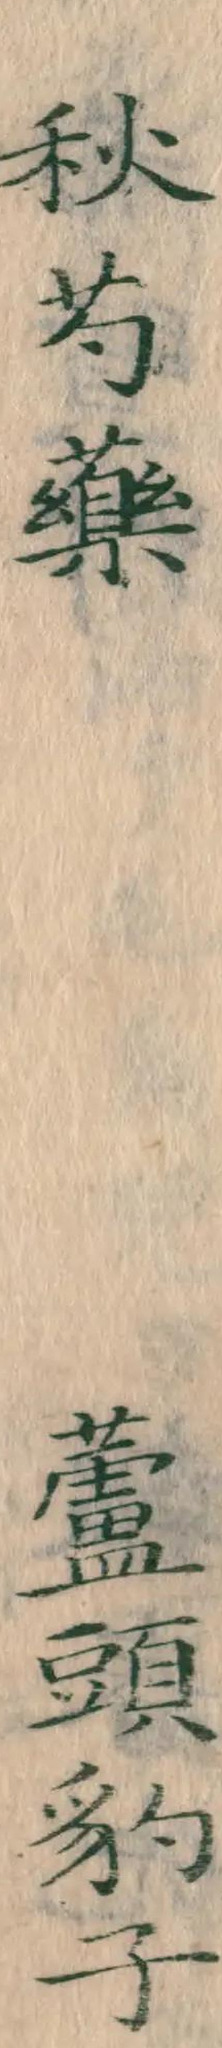秋芍薬芦頭豹子
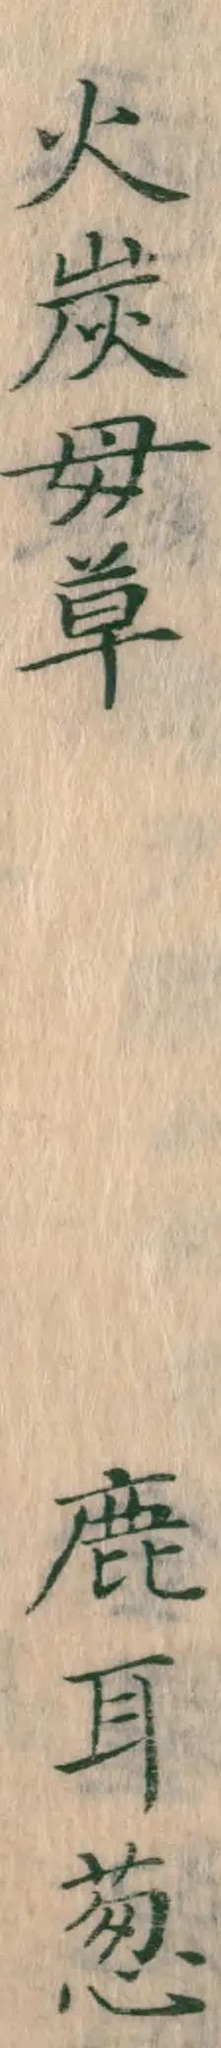火炭母草鹿耳葱
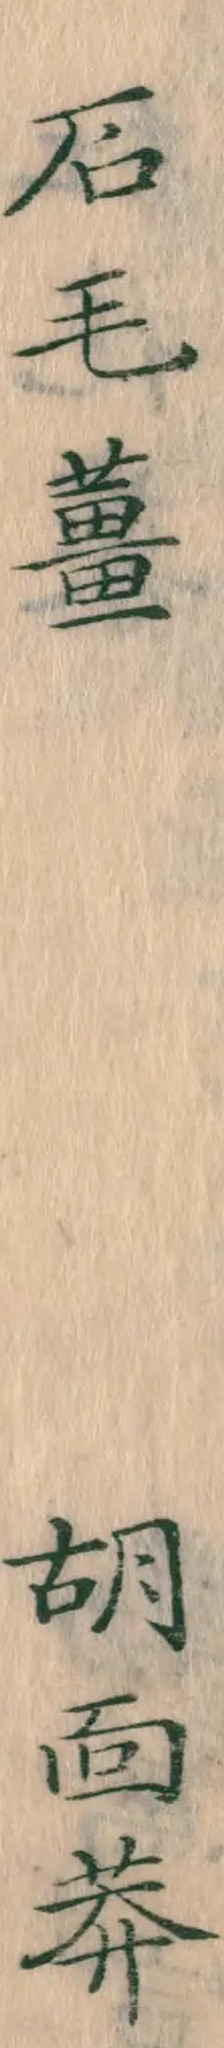石毛薑胡面莽
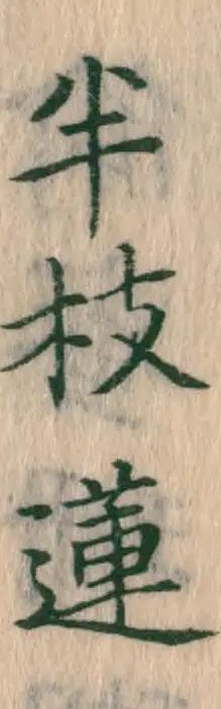半枝蓮
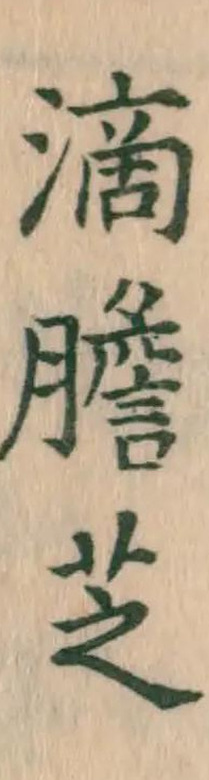滴膽芝

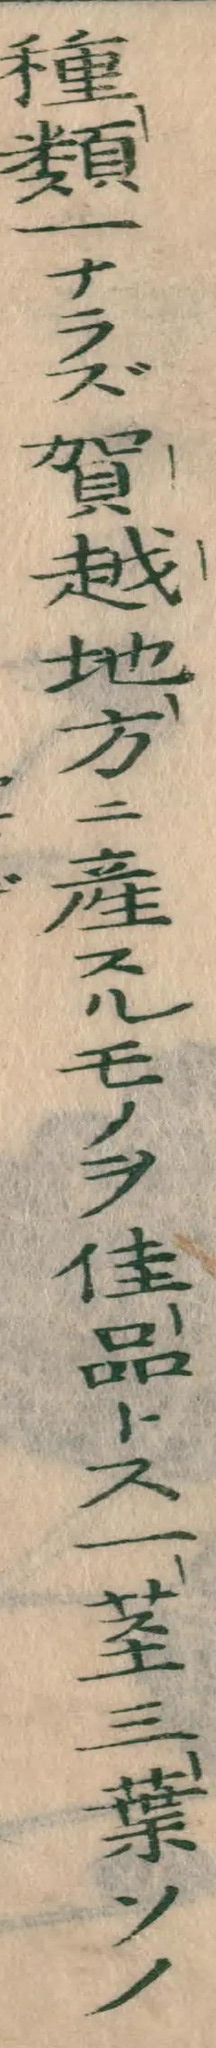種-類一ナラズ賀越地-方ニ産スルモノヲ佳-品トス一-茎三-葉ソノ
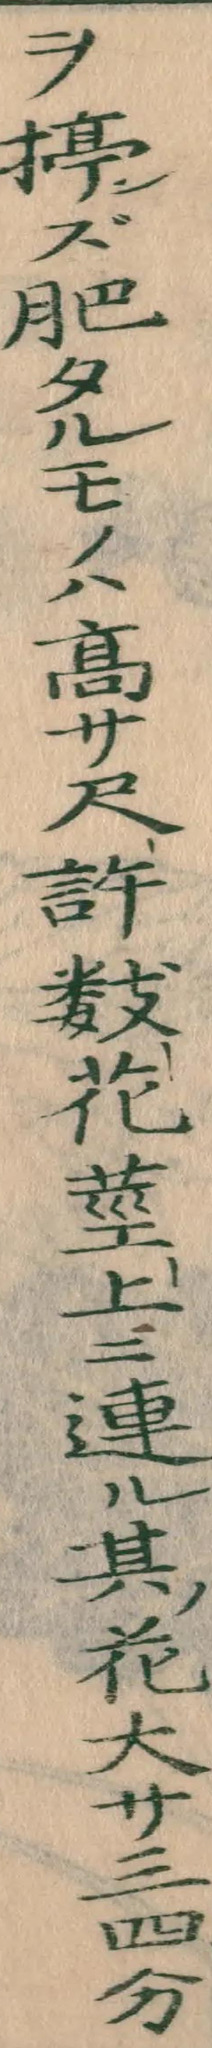ヲ揨ズ肥タルモノハ高サ尺-許数-花茎-上ニ連ル其花大サ三-四-分
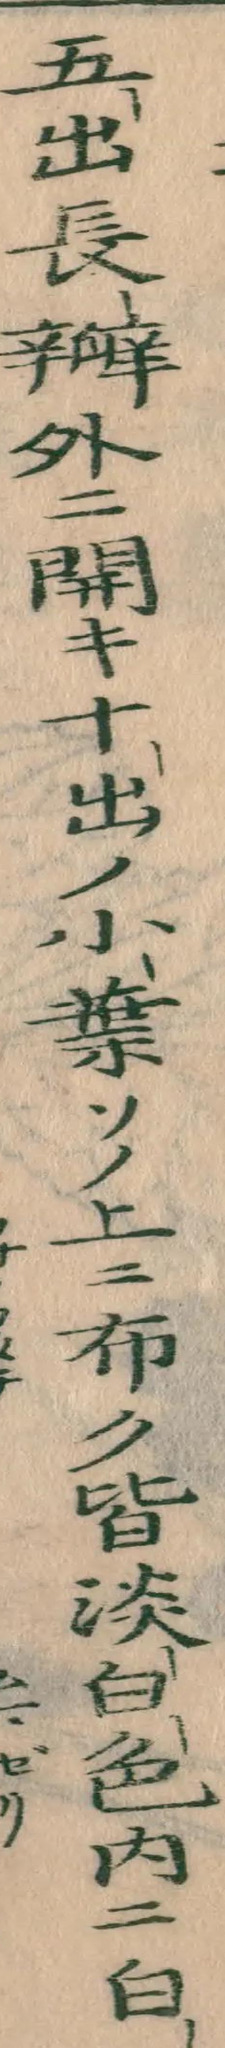五-出長-弁外ニ開キ十-出ノ小-葉ソノ上ニ布ク皆淡-白-色内ニ白-
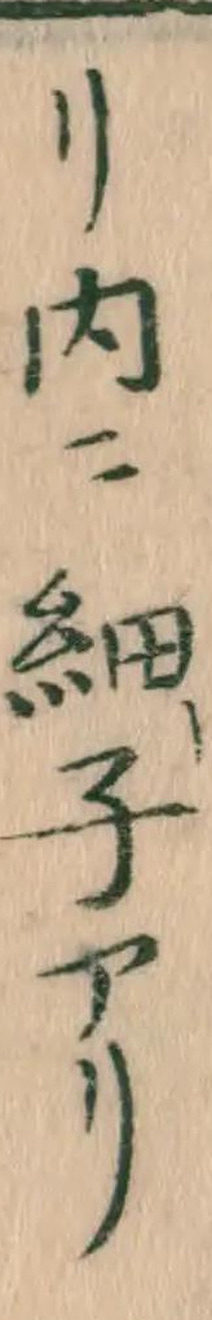リ内ニ細-子アリ
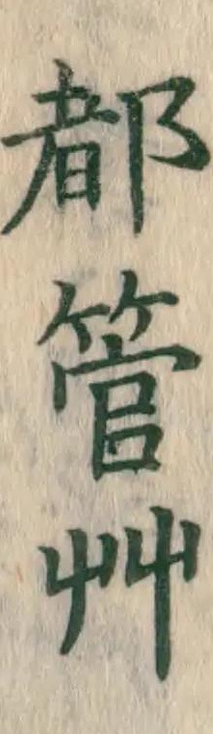都管艸

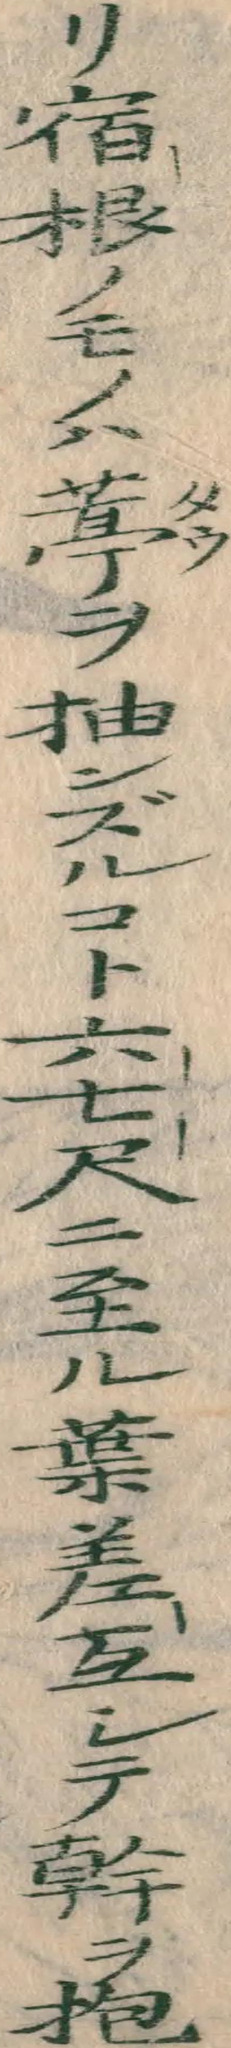リ宿-根ノモノハ葶ヲ抽ンズルコト六-七-尺ニ至ル葉差-互シテ幹ヲ抱
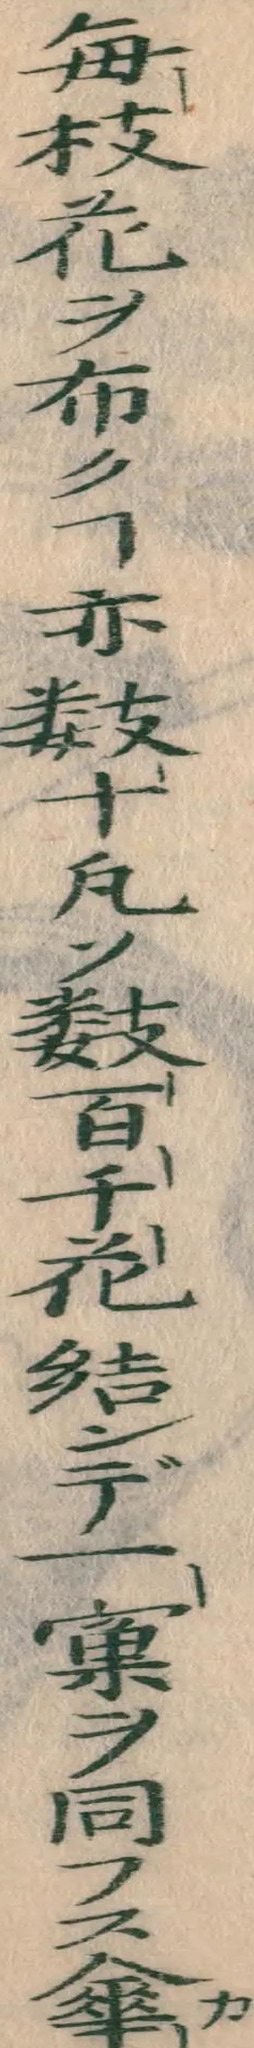毎-枝花ヲ布クコト亦数-十凡ソ数-百-千-花結ンデ一-ヲ同フス傘-
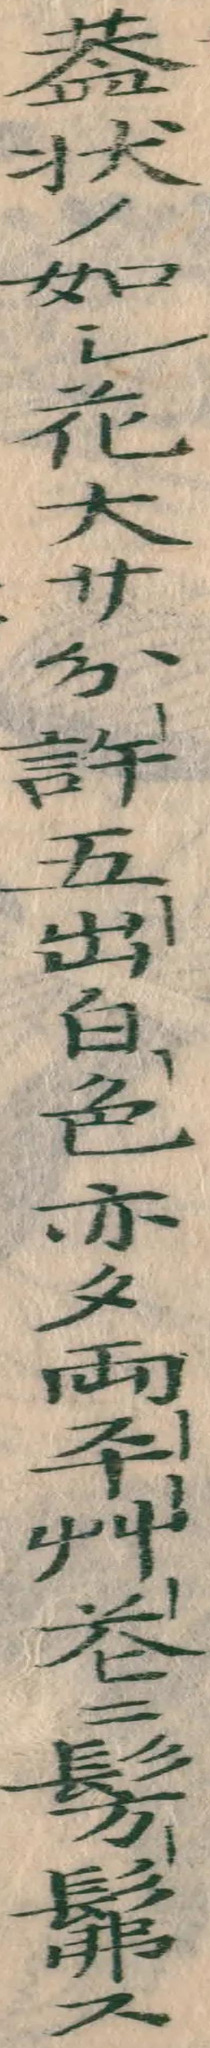蓋状ノ如シ花大サ分-許五-出白-色亦タ両-平-艸-花ニ髣-髴ス
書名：花彙 草部4巻木部4巻. [1]
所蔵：国立国会図書館 National Diet Library, JAPAN
